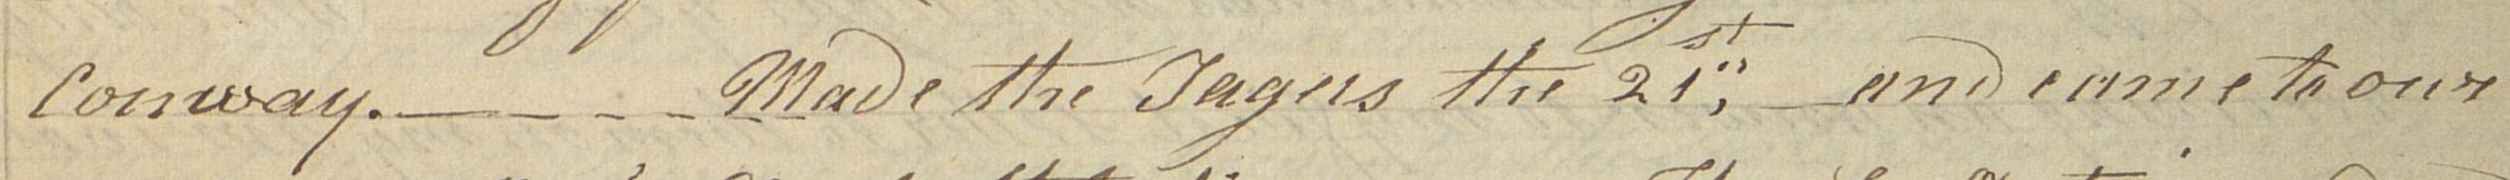conway. Made the Tagens the 21^st;- and came to our
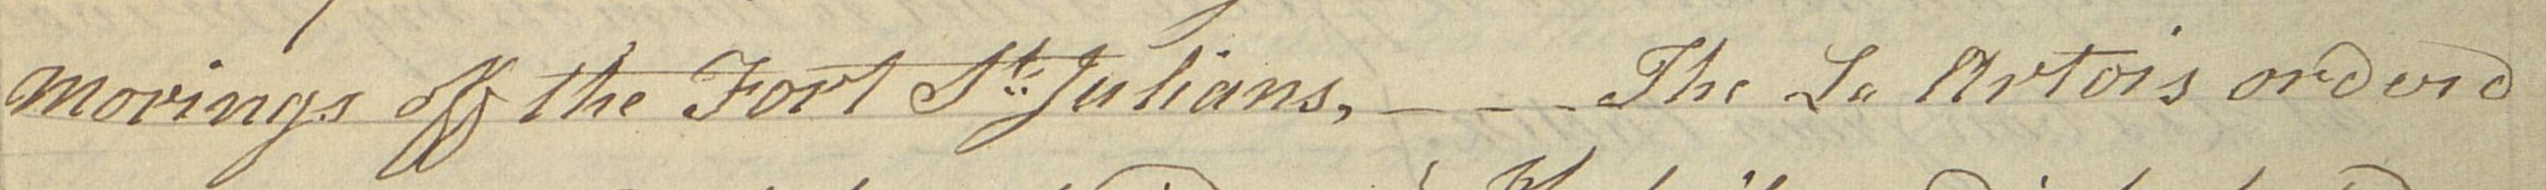morings off the Fort S^t. Julians, The L. Artois orderd
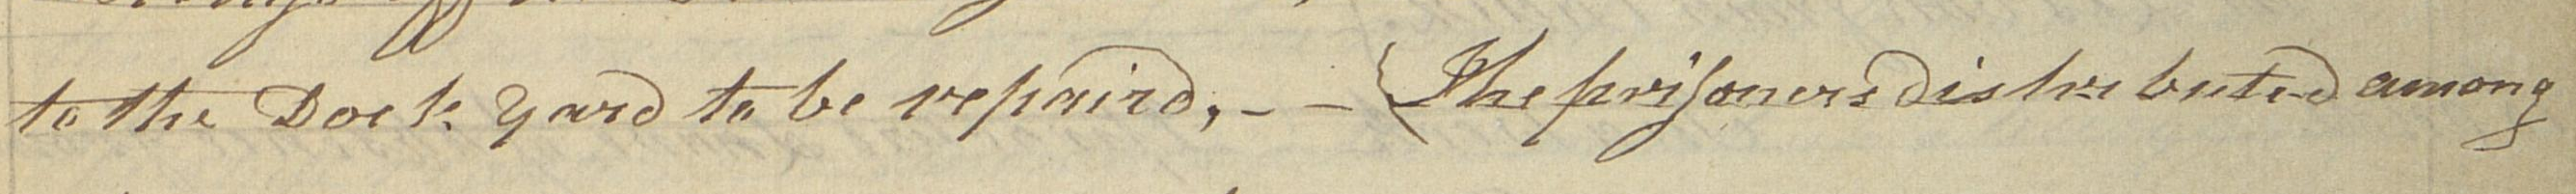to the Dock yard to be repaired. (The prisoners distributed among
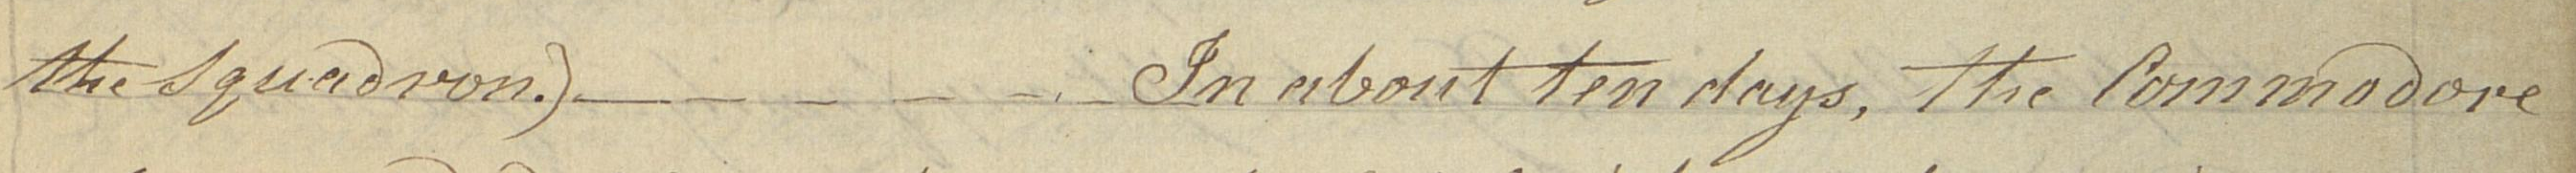the squadron.) In about ten days, the Commodore
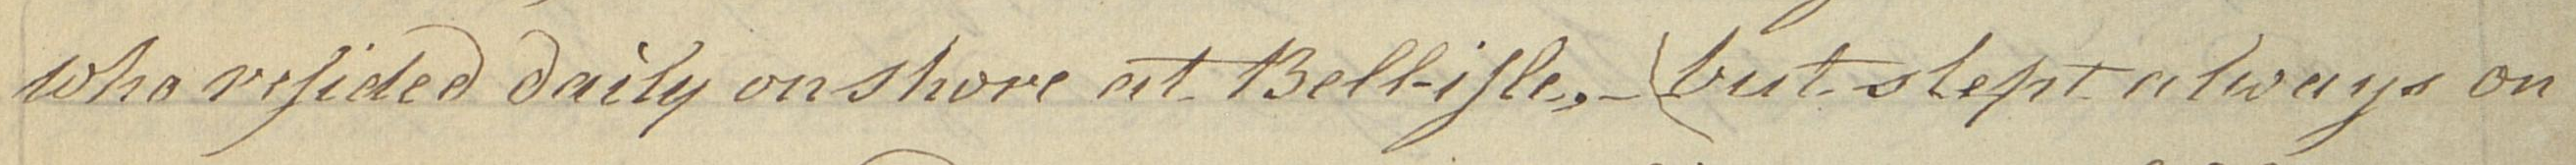who resided daily on shore at Bellisle (but slept always on
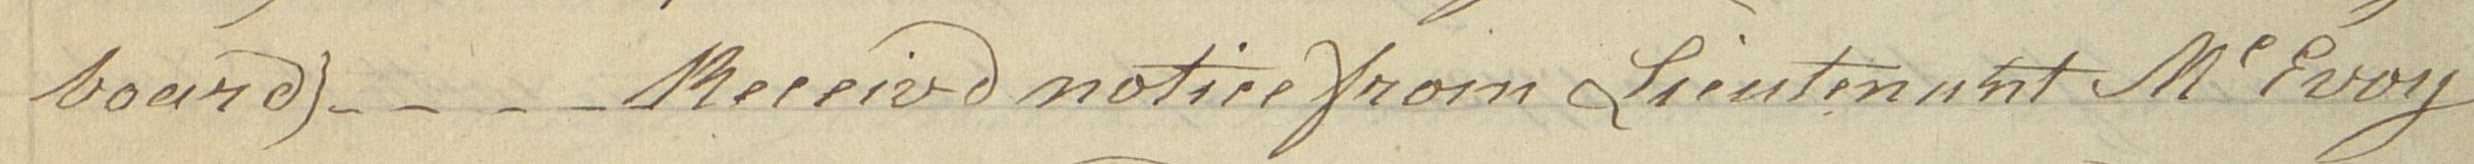board) Receivd notice from Lieutenant M^cEvoy
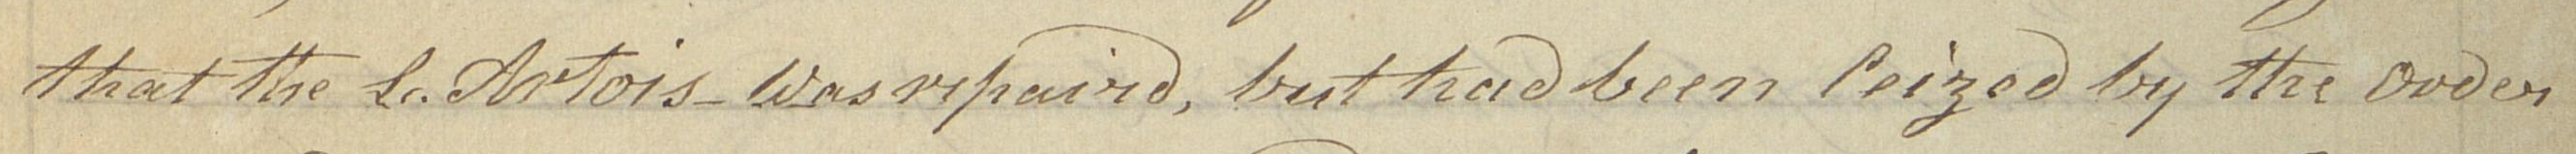that the L. Artois was repaird, but had been ceized by the order
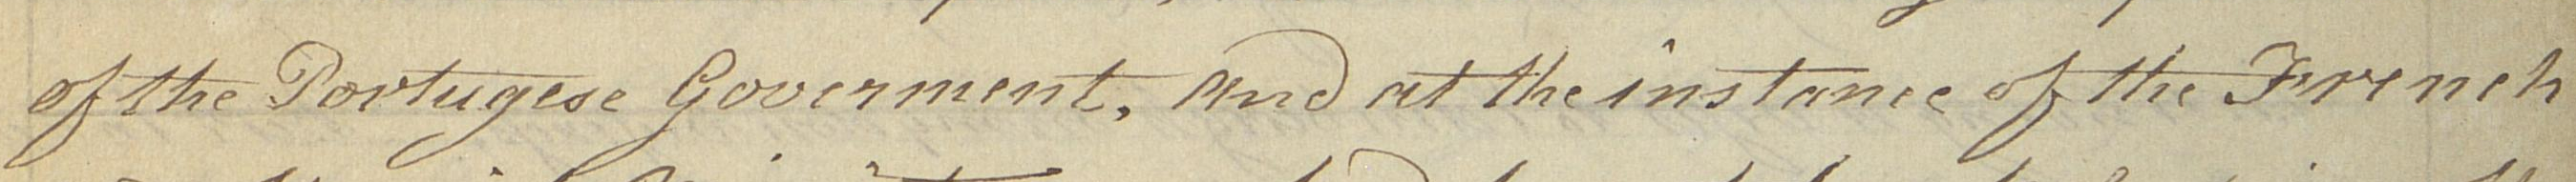of the Portugese Government. and at the instance of the French
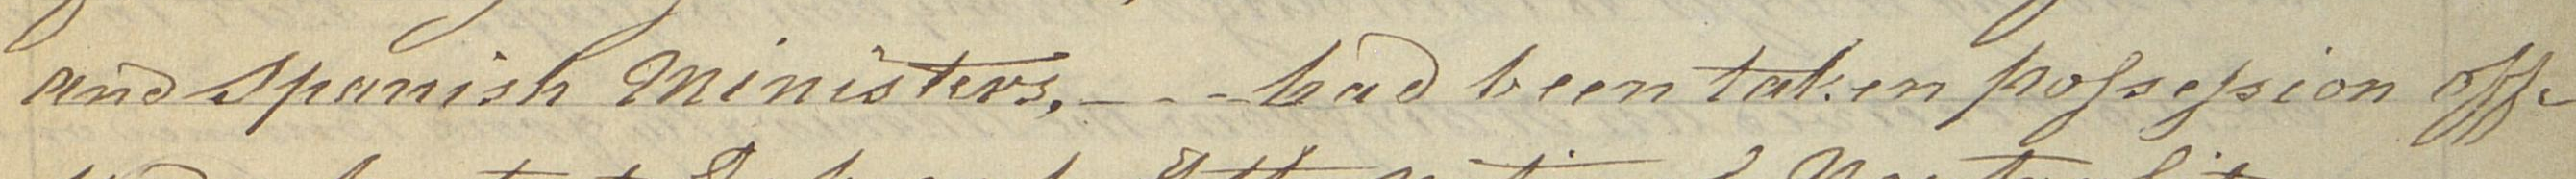arnd Spanish Ministers,-- had been taken possession off
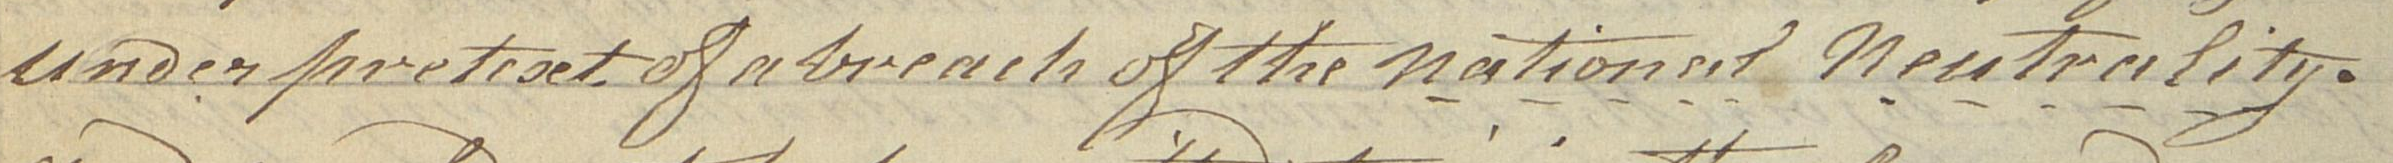under pretext of a breach of the national Neutrality.
